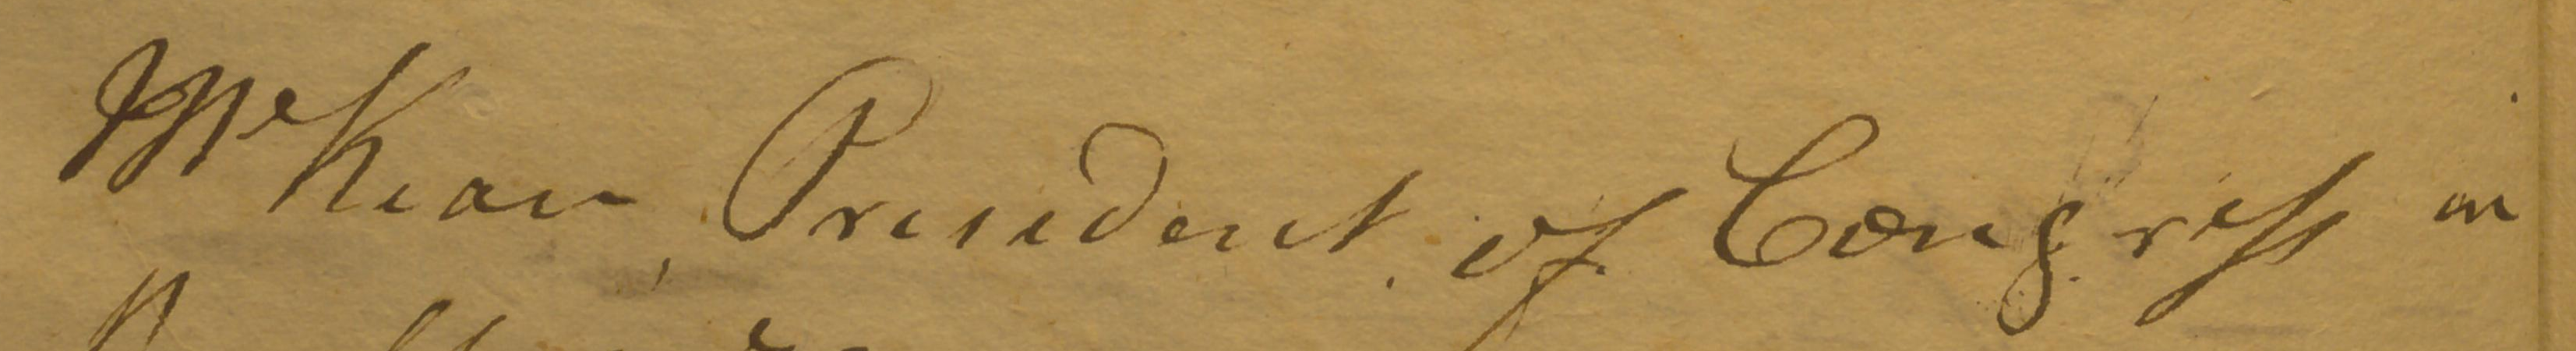M^cKean President of Congress in
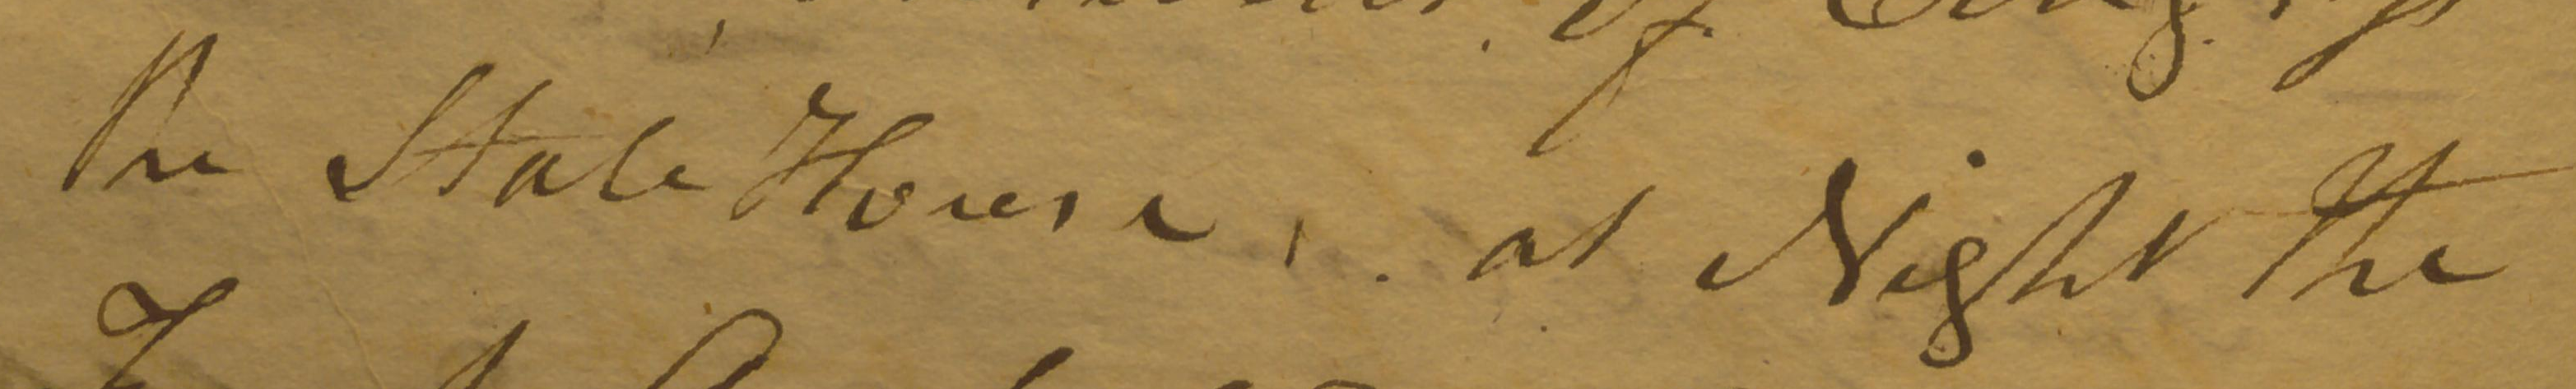the State House, at Night the
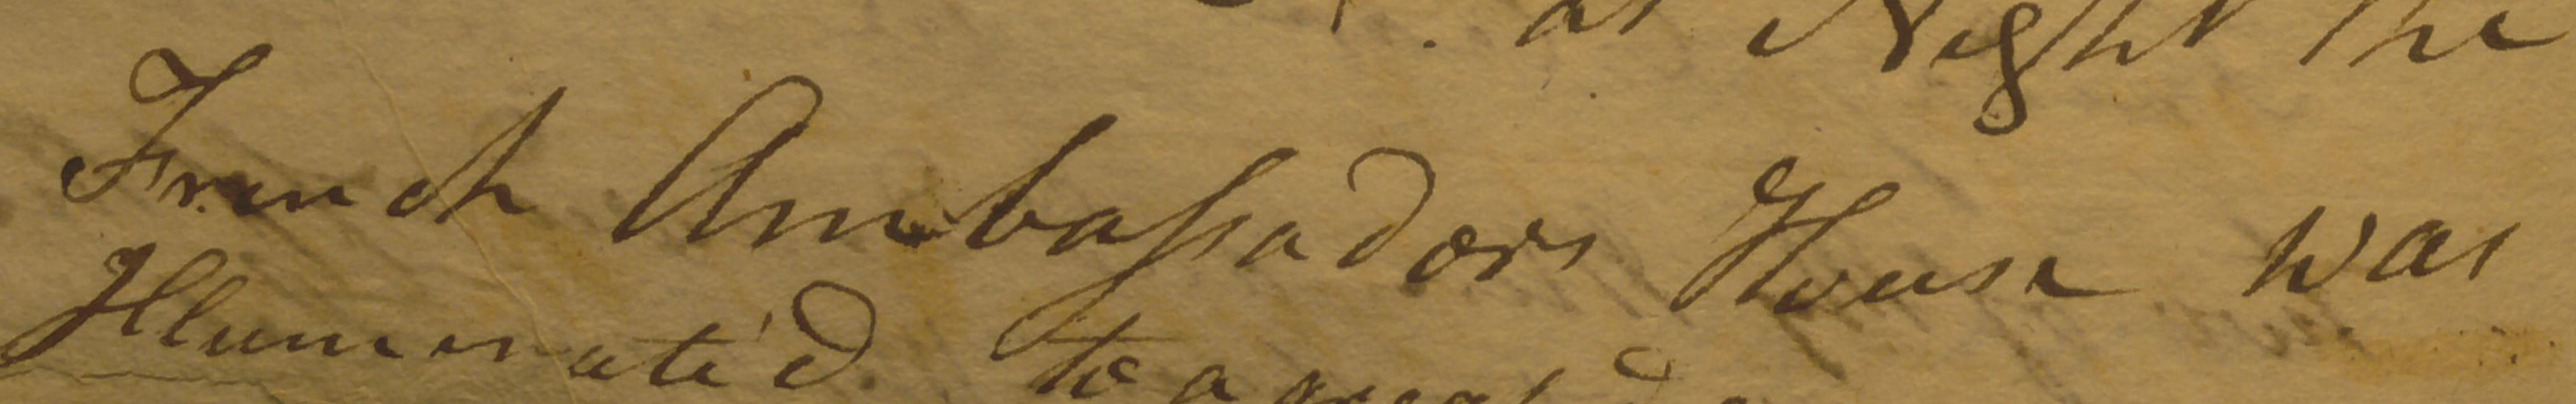French Ambassadors House was
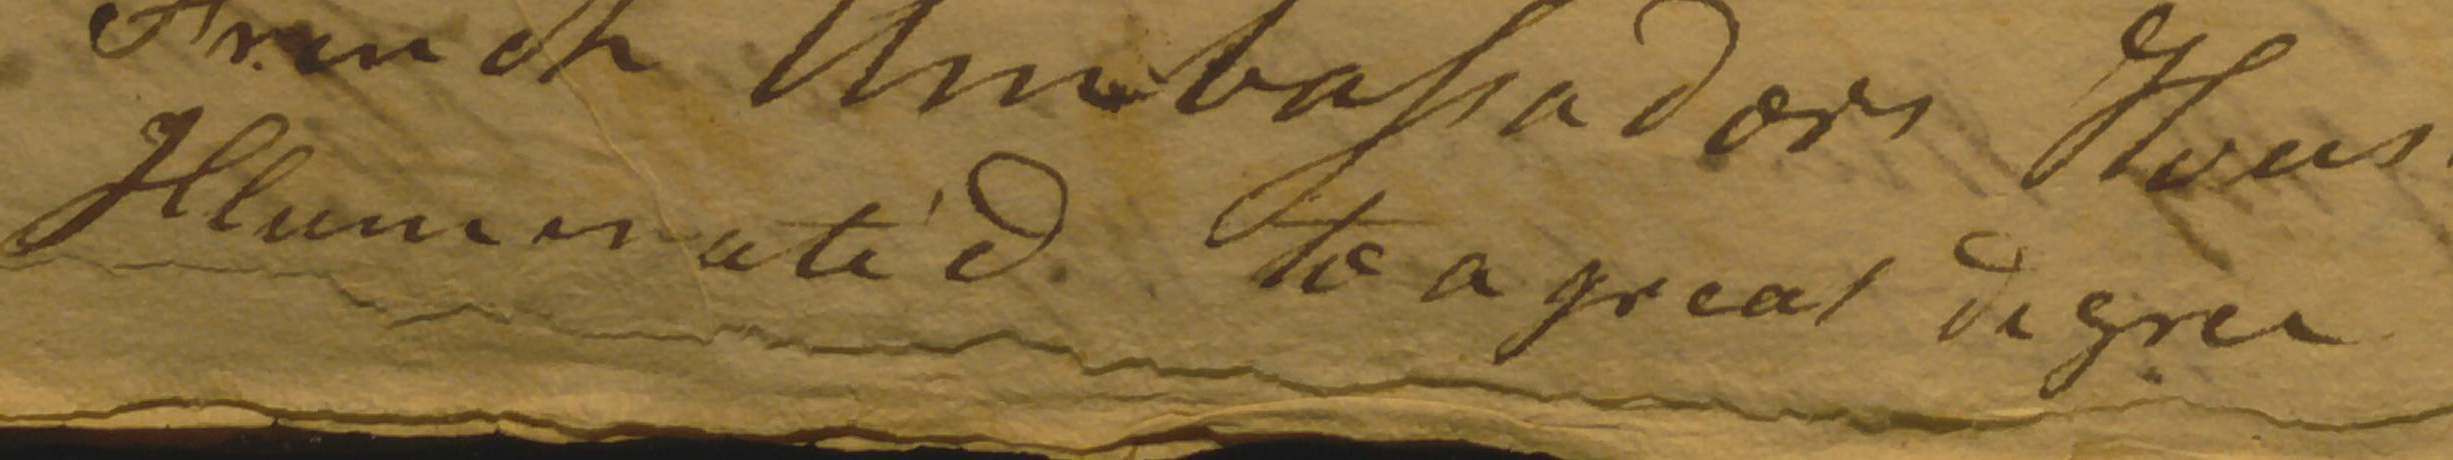Illuminated to a great degree
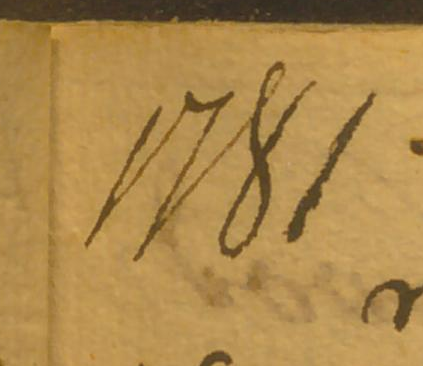1781
